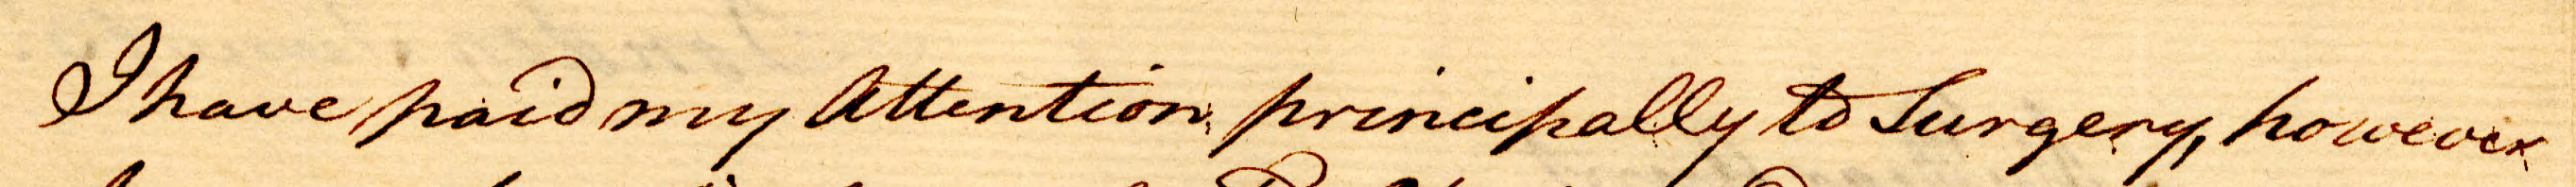I have paid my Attention principally to Surgery, however
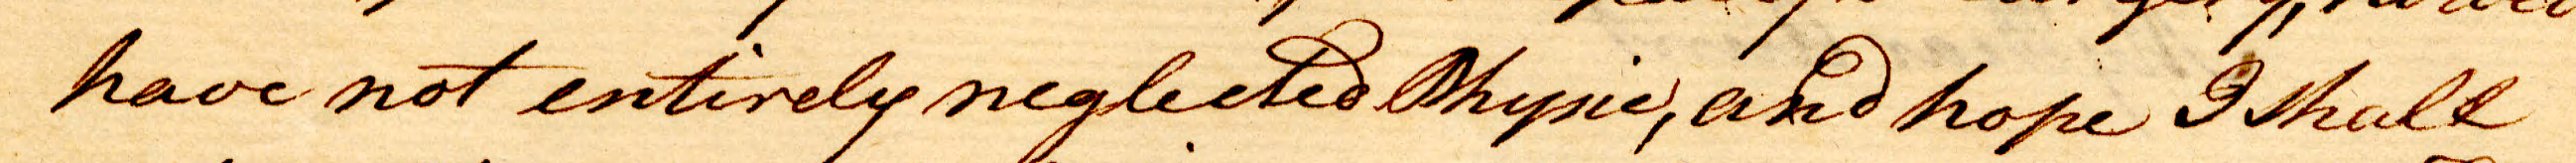have not entirely neglected Physic, and hope I shall
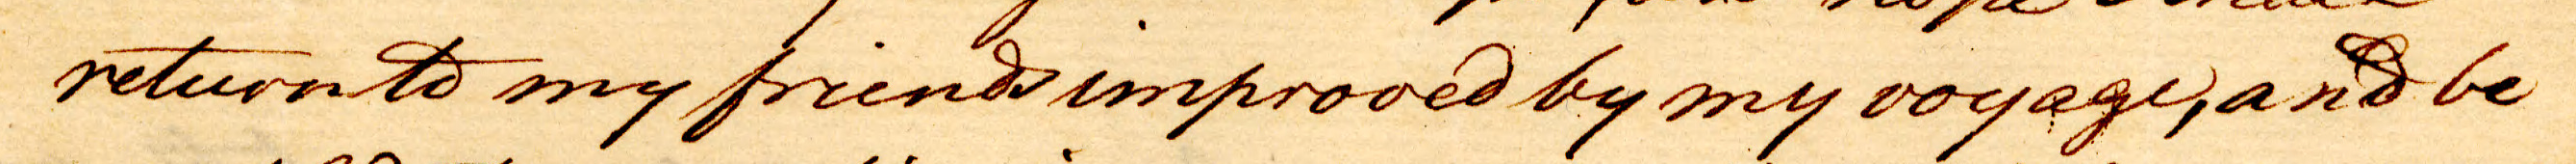return to my friends improved by my voyage, and be
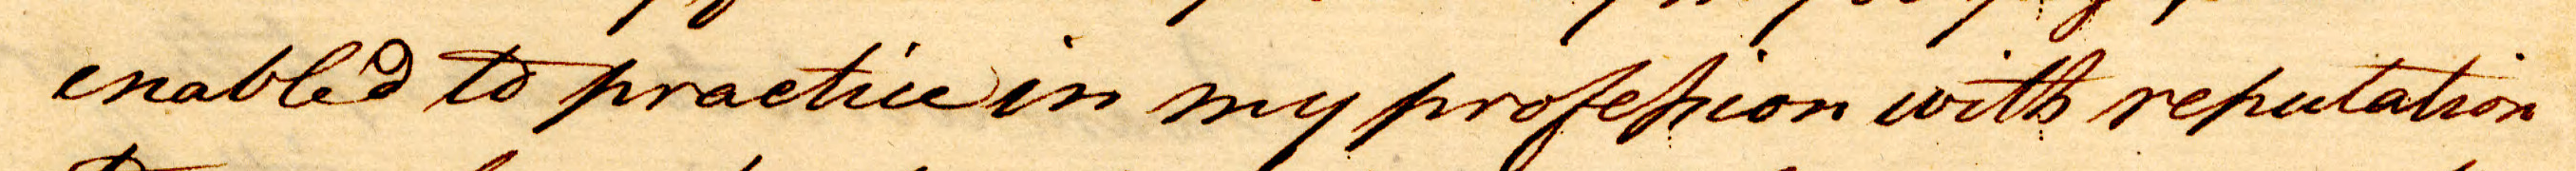enabled to practice in my profession with reputation
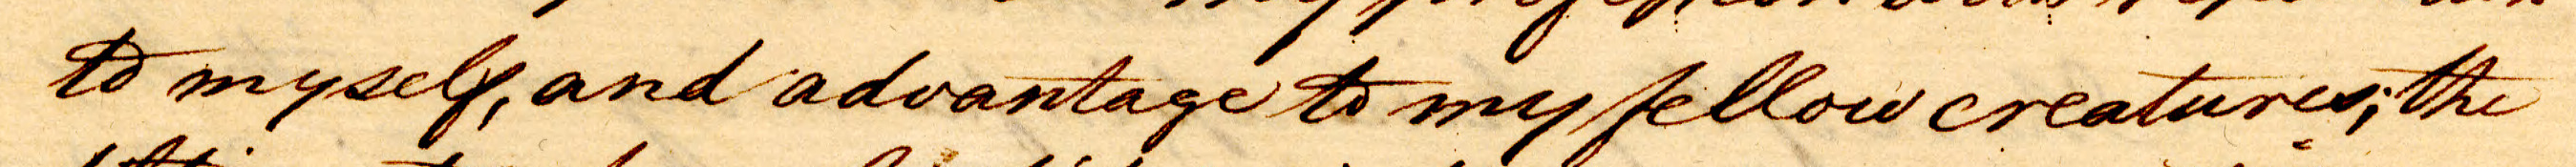to myself, and advantage to my fellow creatures; the
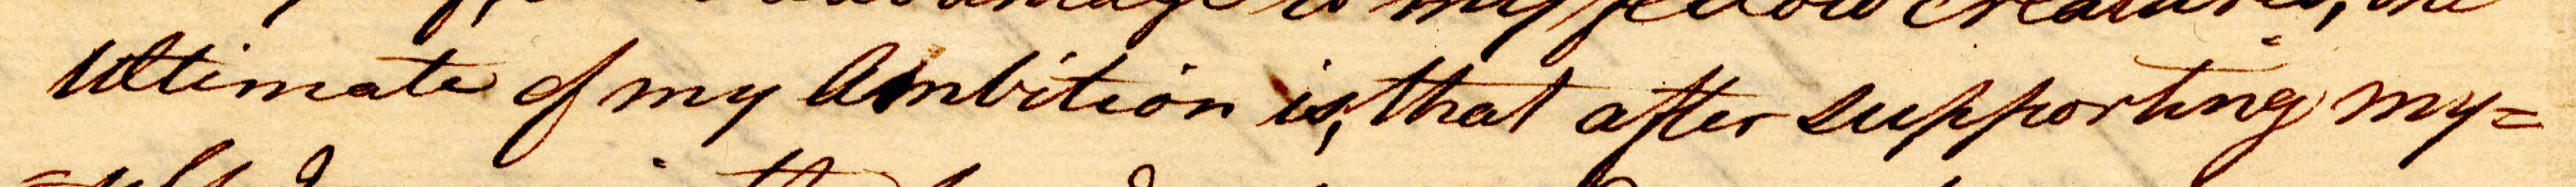ultimate of my Ambition is, that after supporting my-
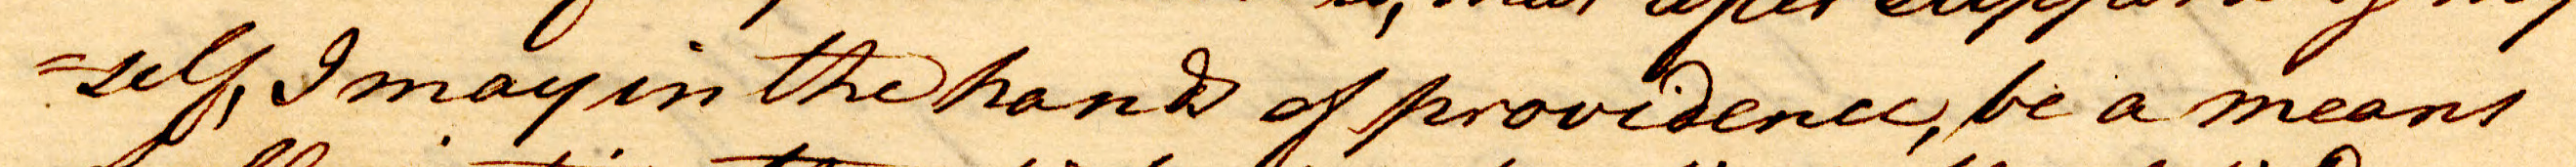-self, I may in the hands of providence, be a means
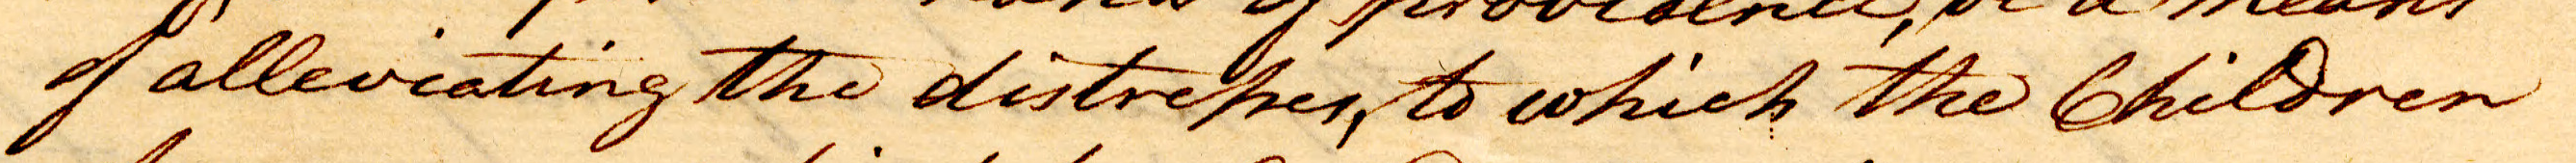of alleviating the distress, to which the Children
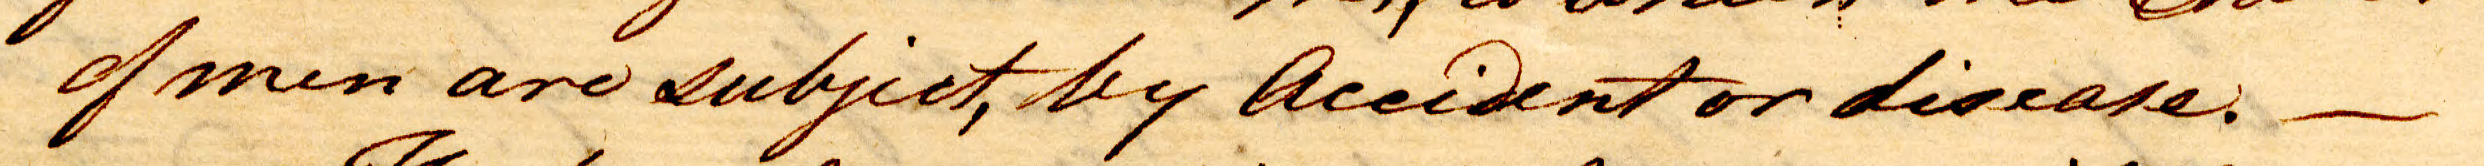of men are subject, by Accident or disease.-
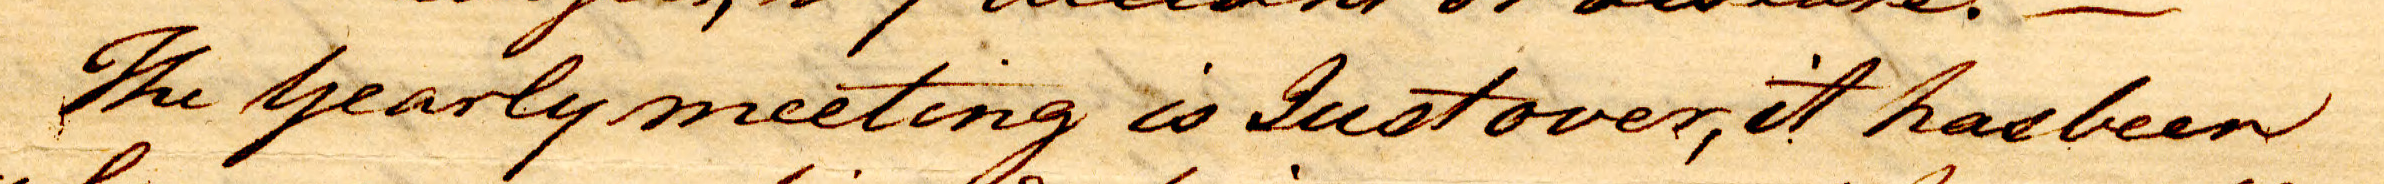The yearly meeting is Just over, it has been
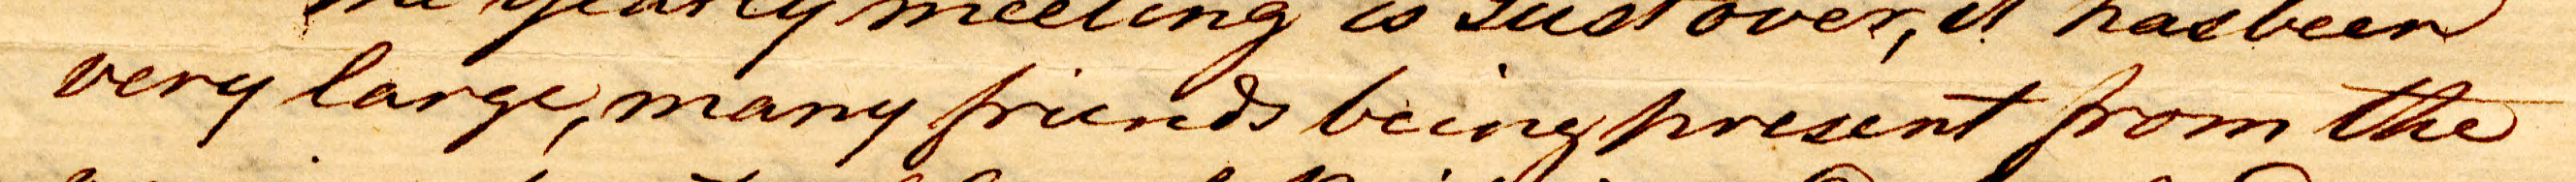very large, many friends being present from the
